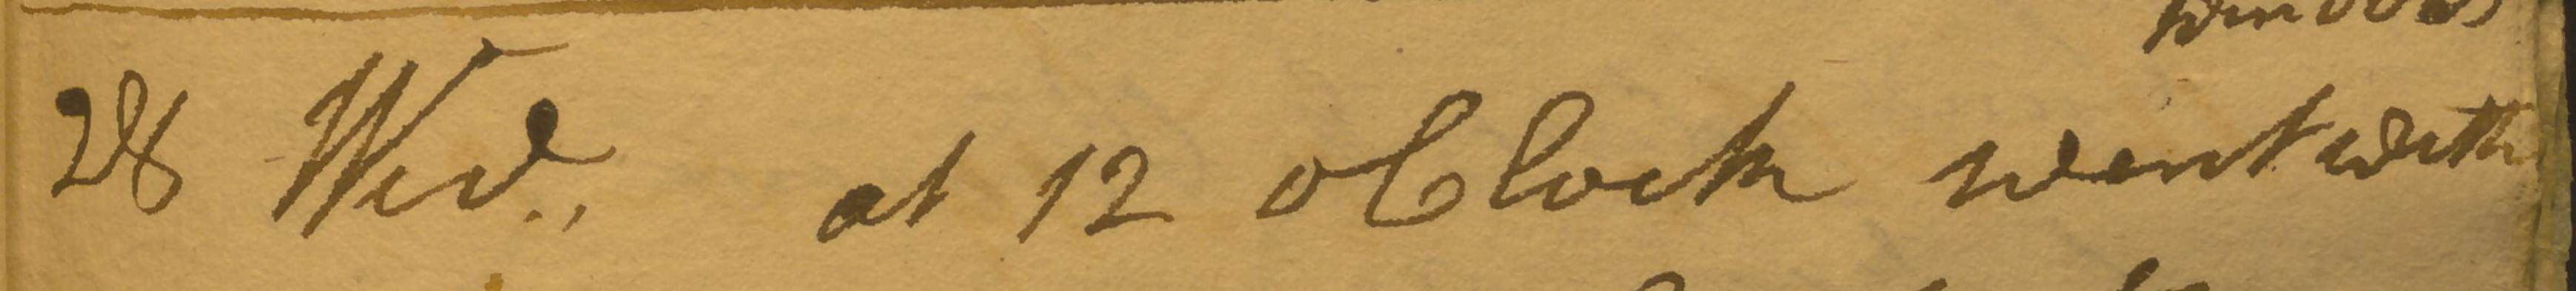28 Wed. at 12 oClock went with
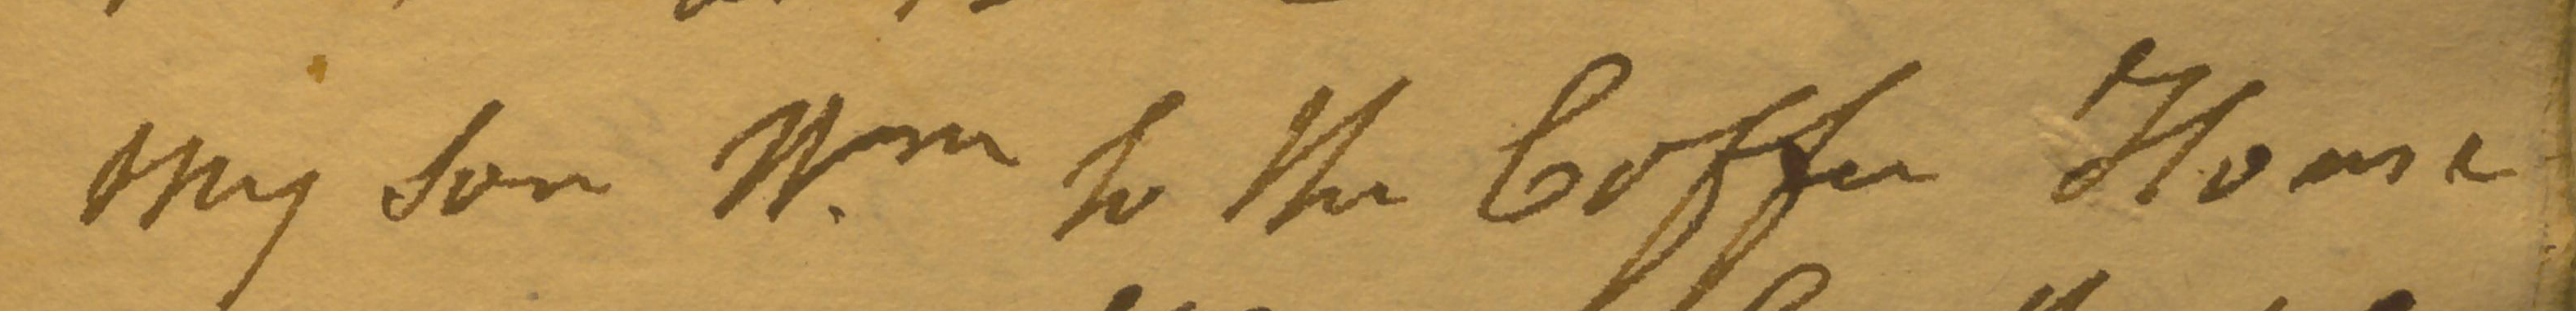ty son W^m. to the Coffer House
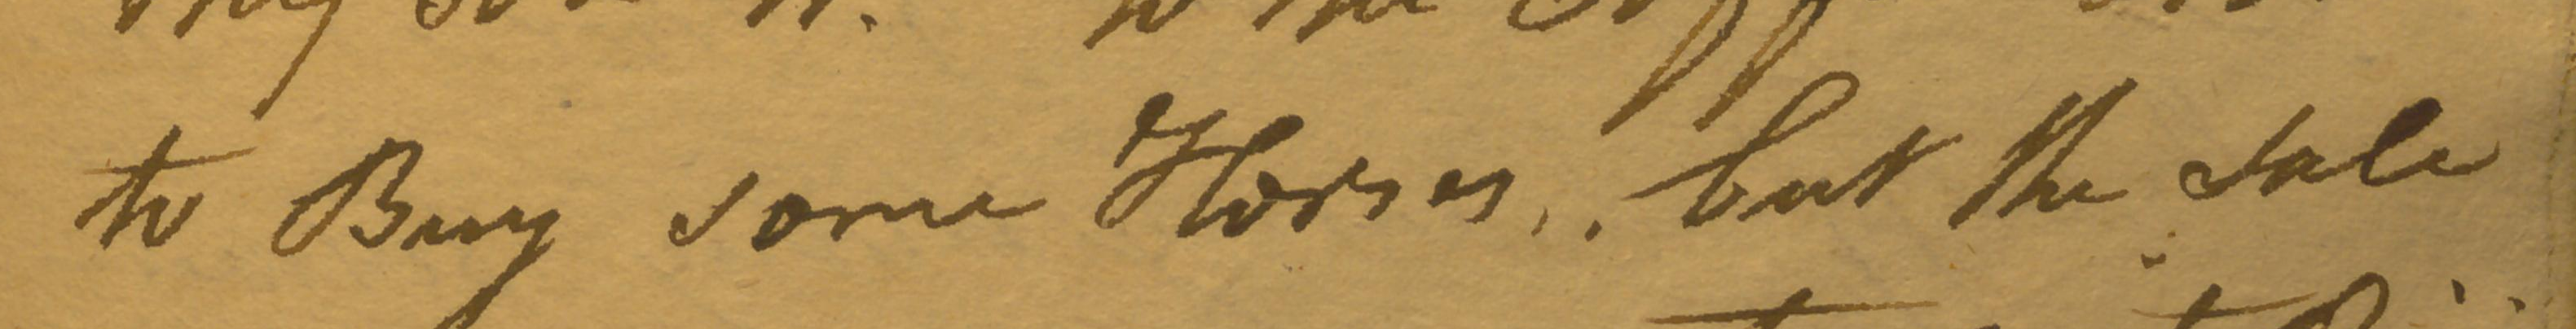to Bery some Horses, but the sale
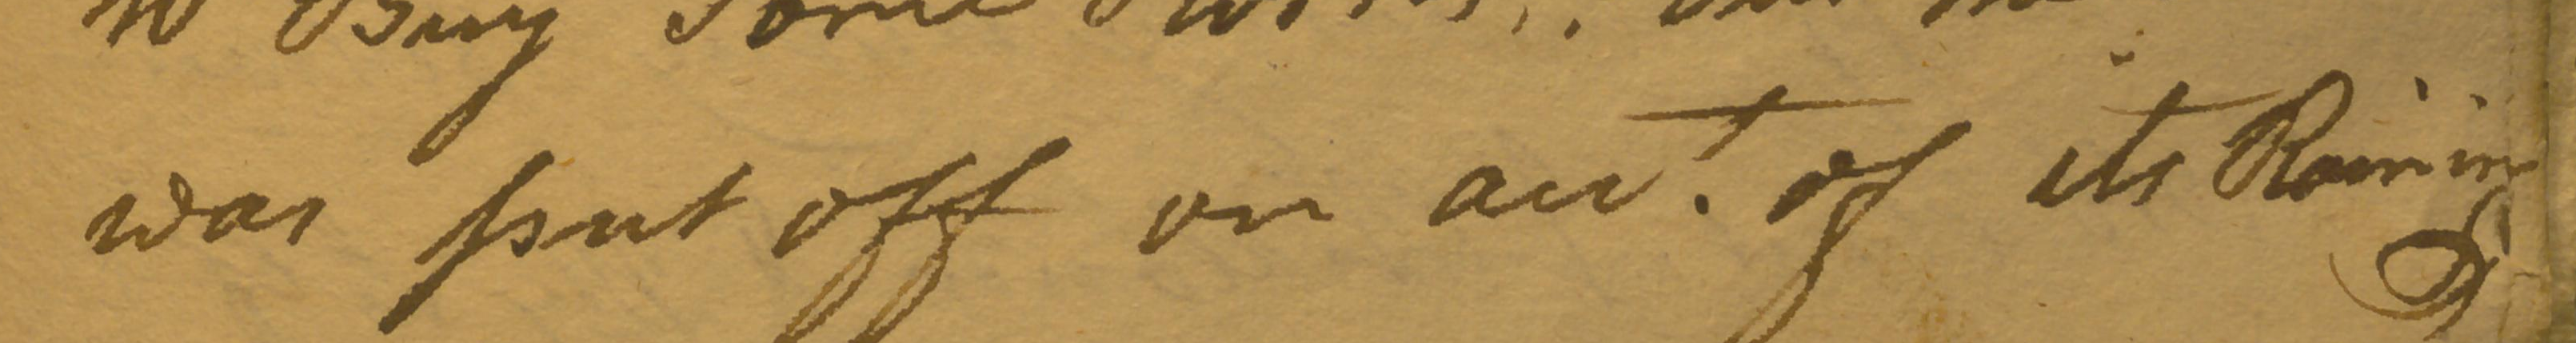was put off on acc^t. of its Raining
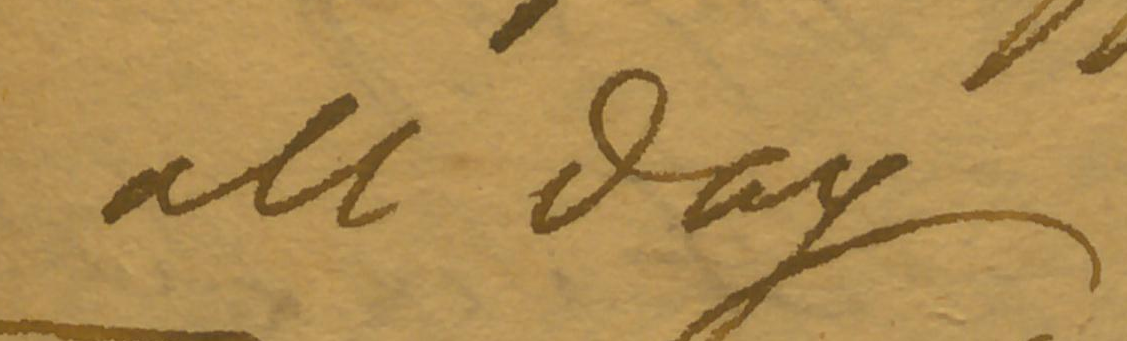all day
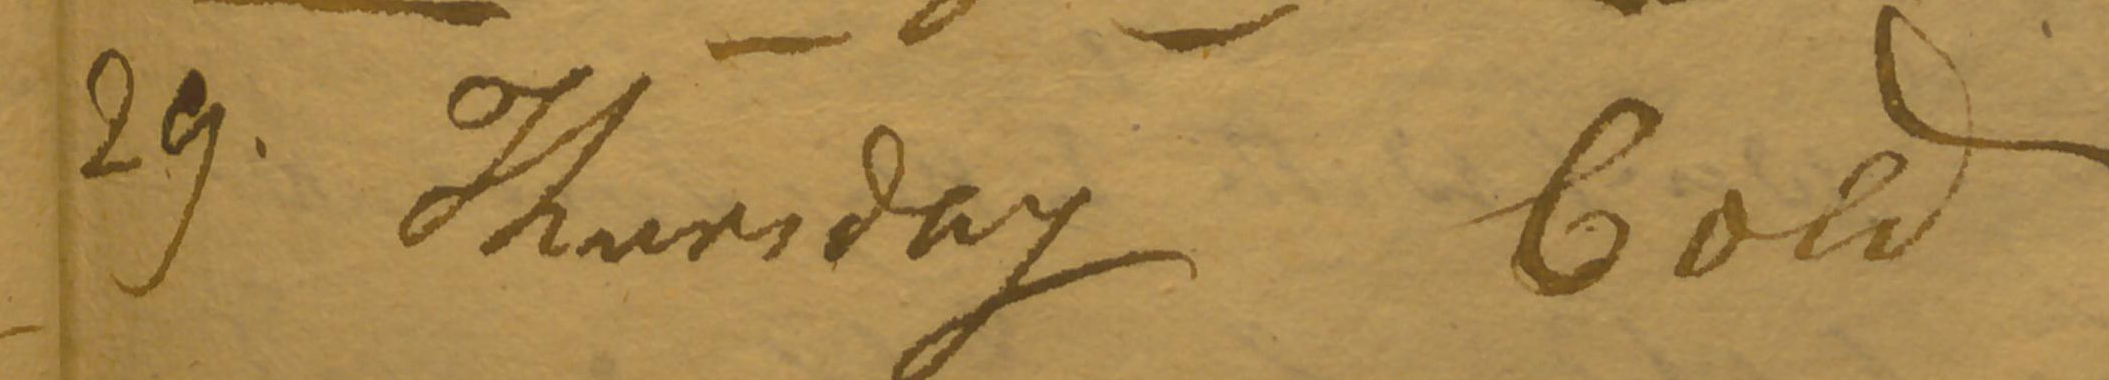29 Thursday Cold
